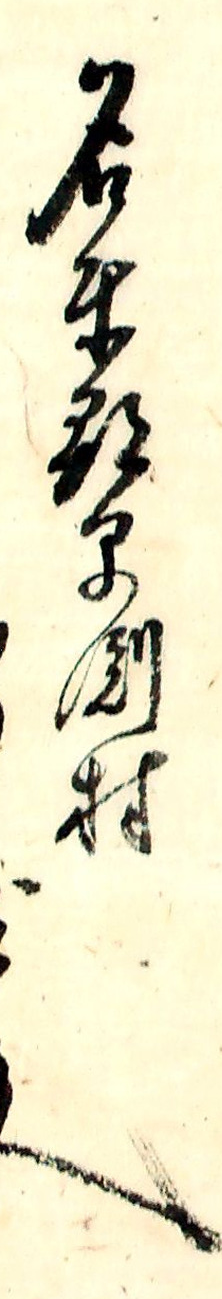名東郡早淵村
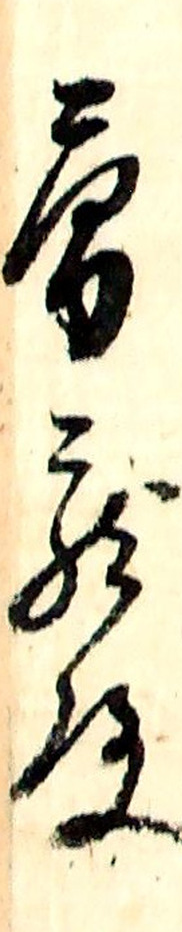勇蔵殿
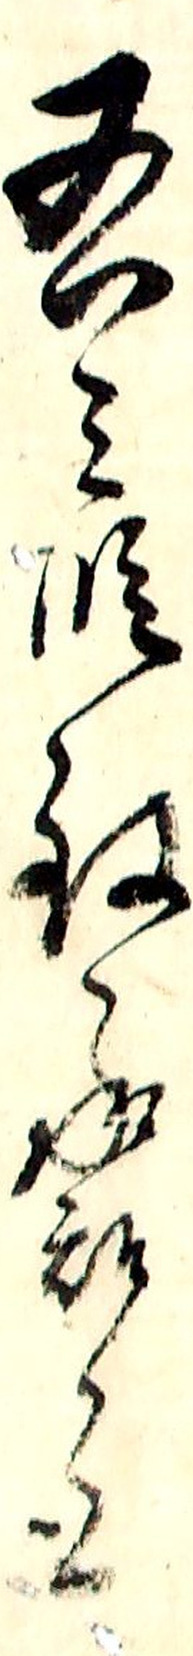右之段致承知候以上
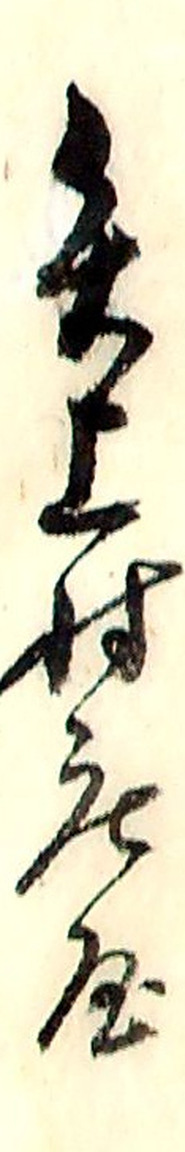矢上村庄屋
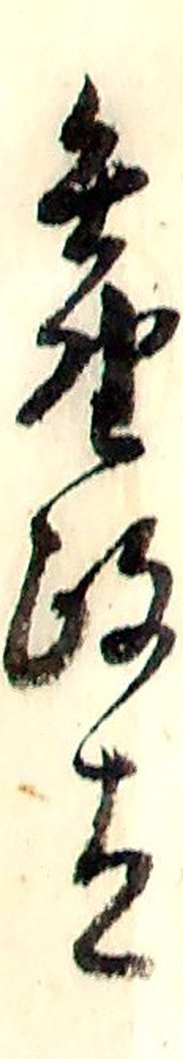矢野政太

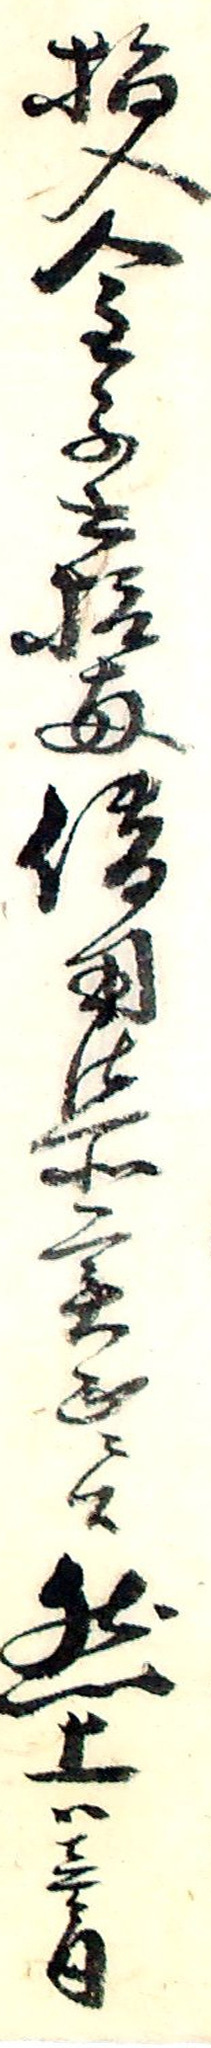指入金子六拾両借用仕所実正に候然上は壱月
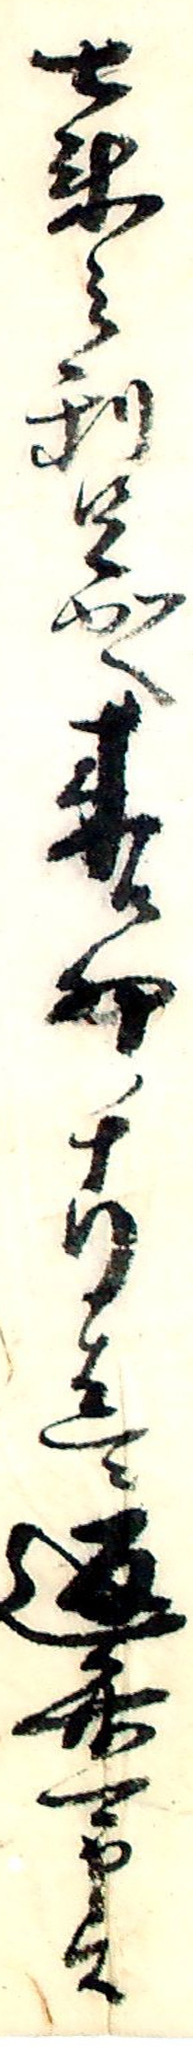七朱之利足加へ来る卯ノ十月迄に返弁可申候
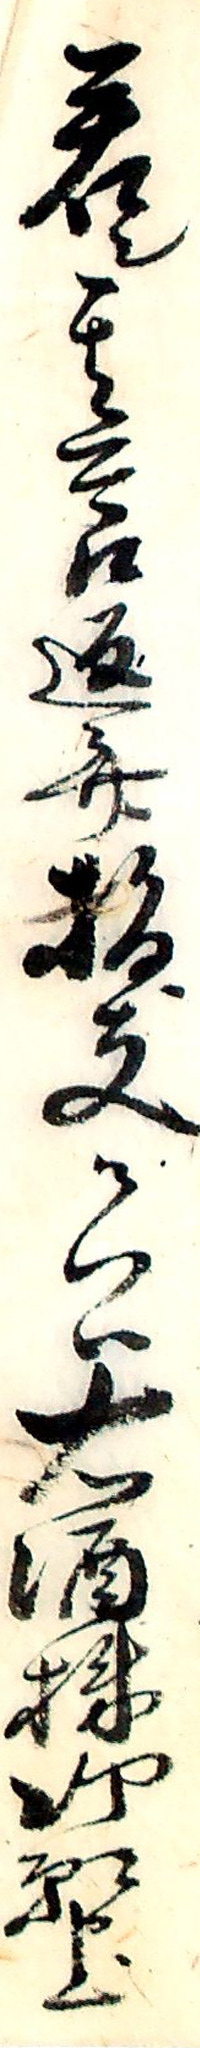若し其節返弁指支候へは右酒株御願申上
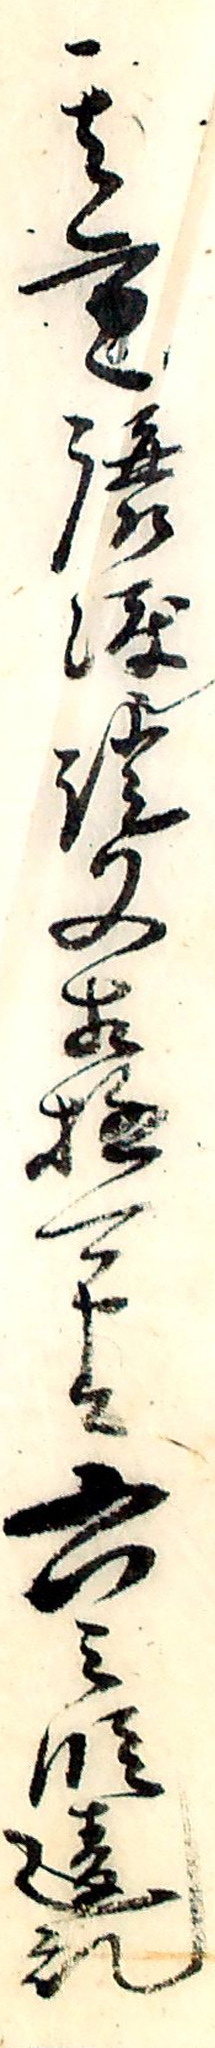其方へ譲渡し証文相極可申候右之段違乱
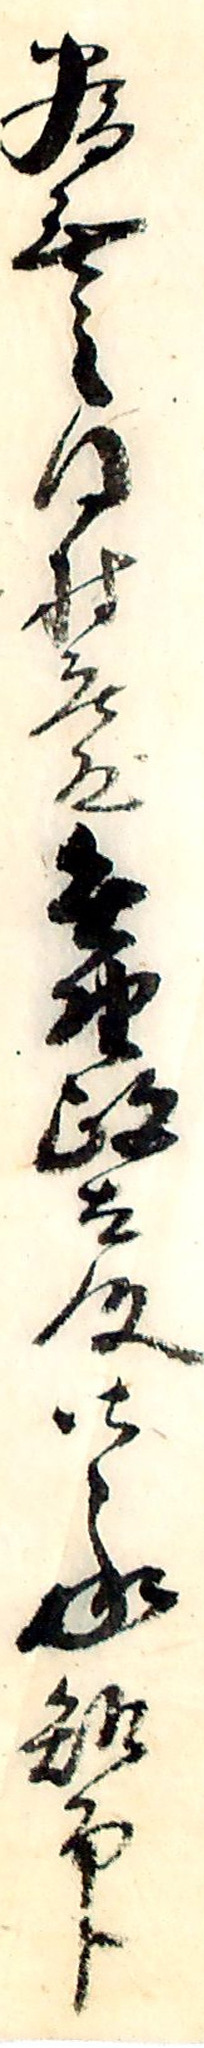為無之同村庄屋矢野政太殿御承知印
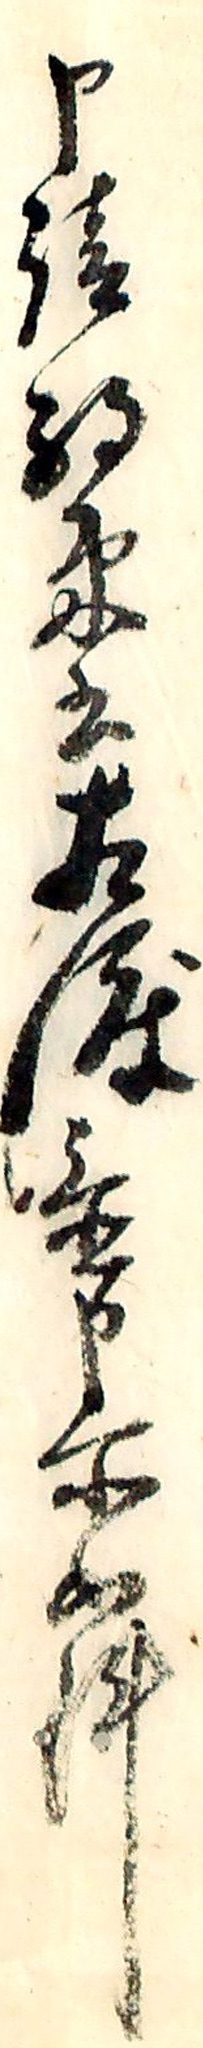申請約束書相渡置申所如件
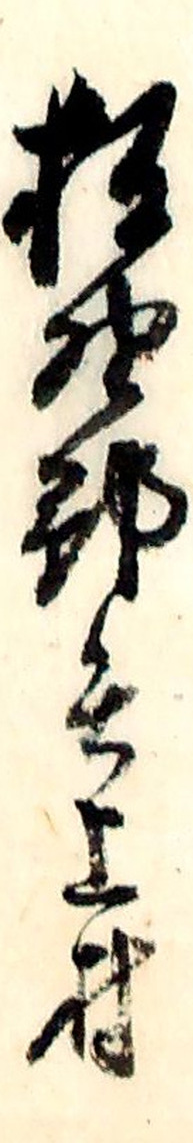板野郡矢上村
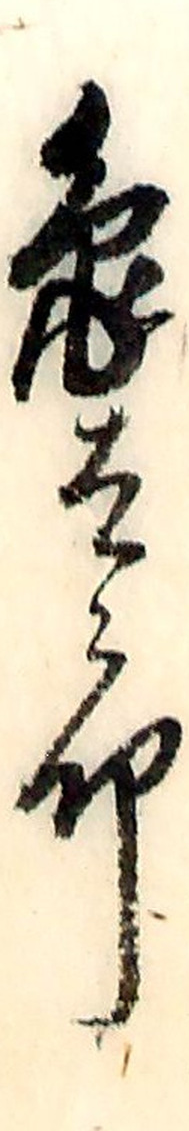亀太郎
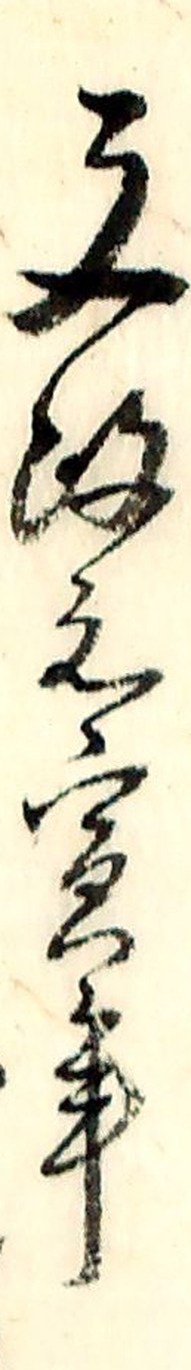文政元寅年
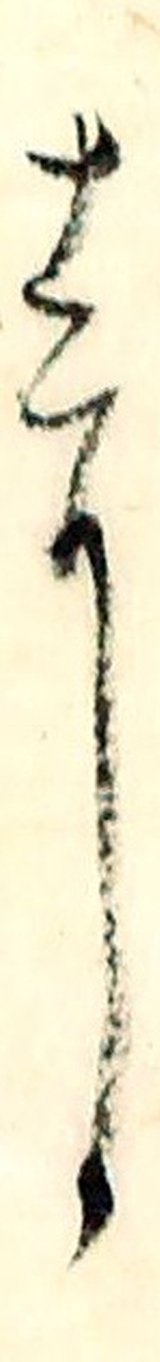十二月
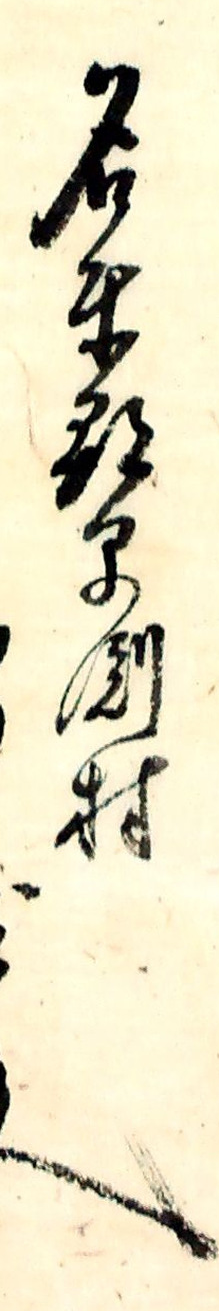名東郡早淵村
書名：諸御願書控(後藤氏壱番）
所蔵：鳴門教育大学 Naruto University of Education
